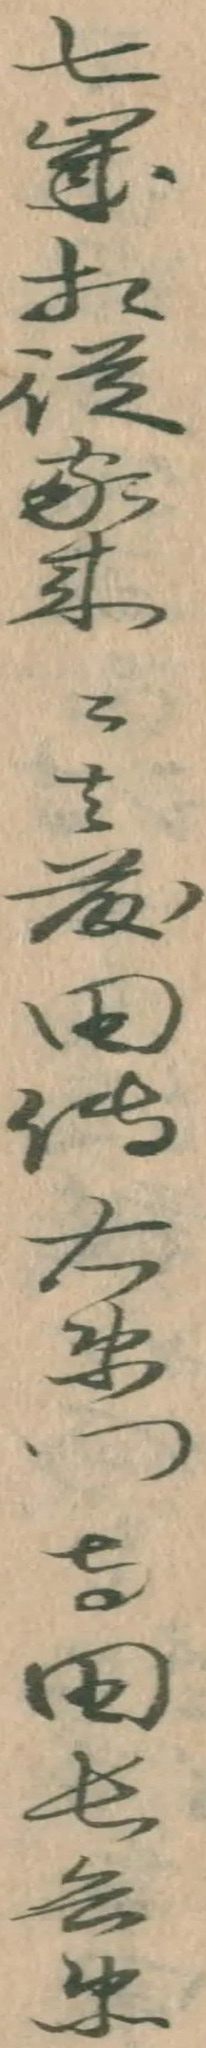七歳相従家来に者藤田伝右衛門寺田長兵衛
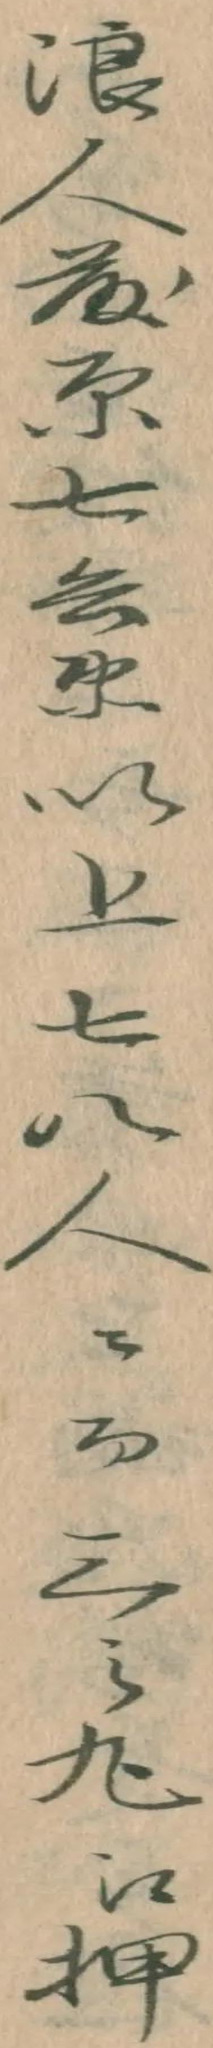浪人藤原七兵衛以上七八人に而三之丸江押
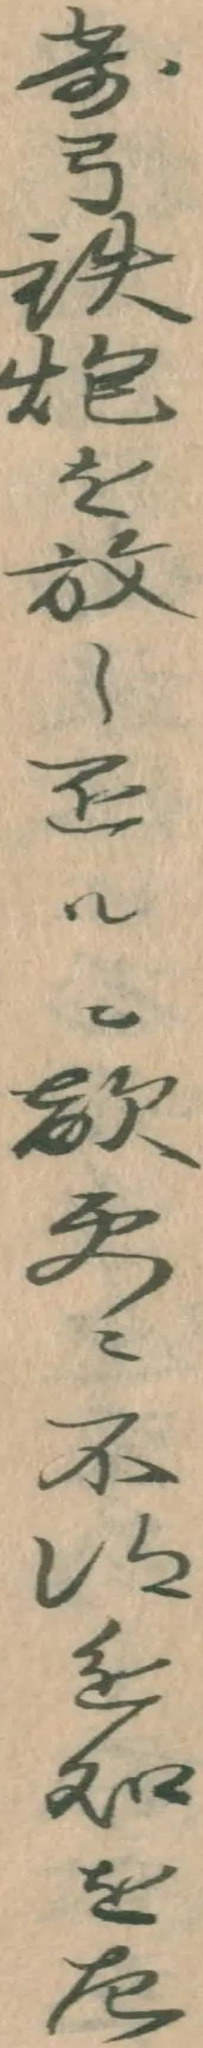寄弓鉄炮を放し懸るに敵更に不得進処を左
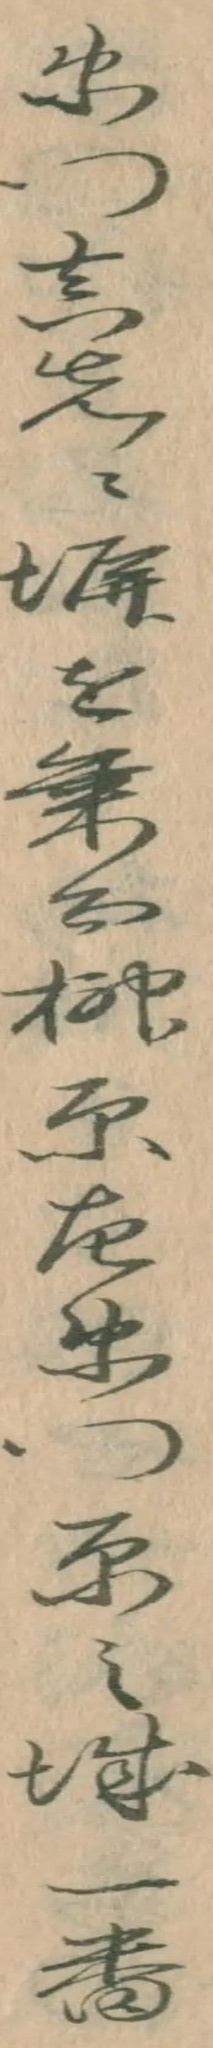衛門真先に塀を乗而榊原左衛門原之城一番
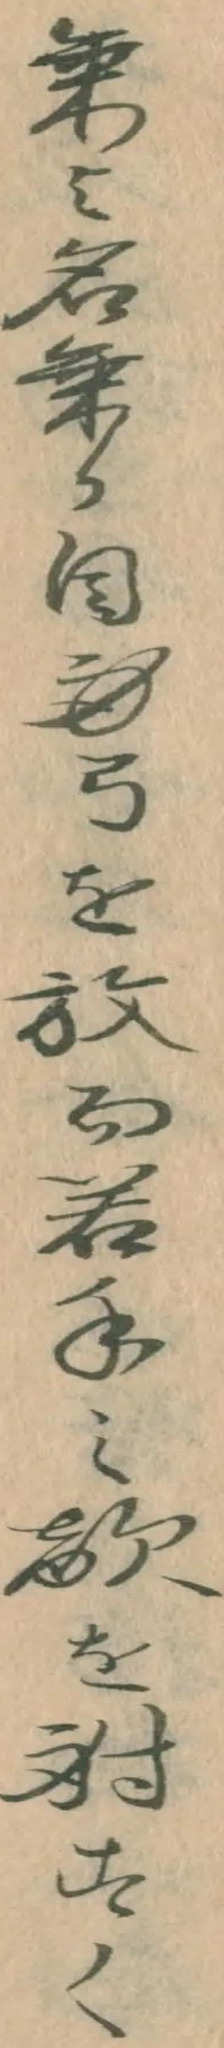乗与名乗り自身弓を放而若手之敵を射春く

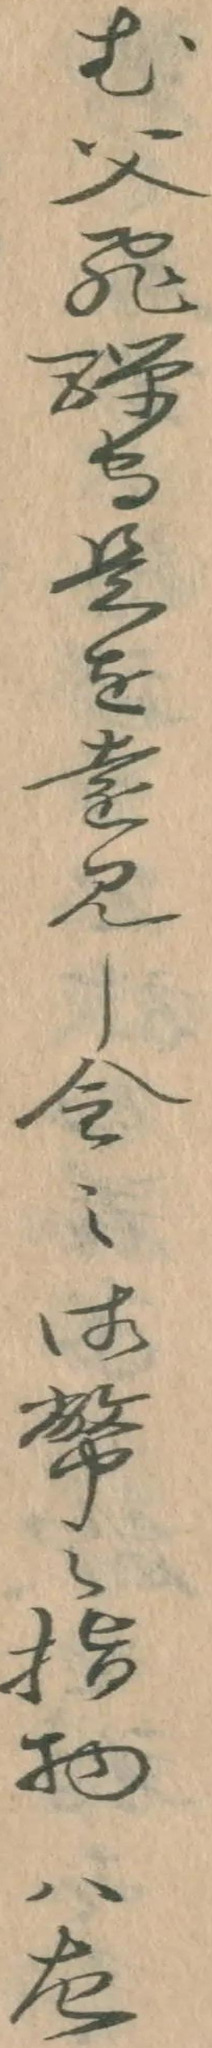む父飛騨守是を遠見し合之御幣之指物は左
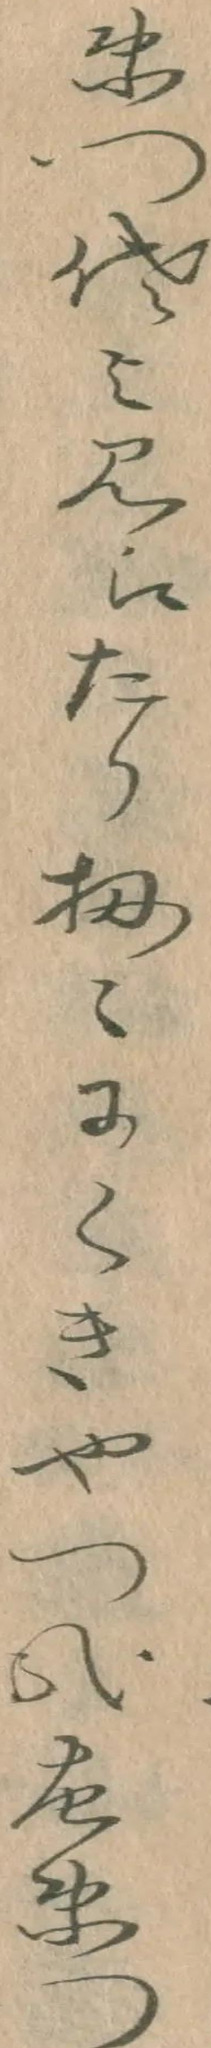衛門佐与見江たり扨々尓くきやつ哉左衛門
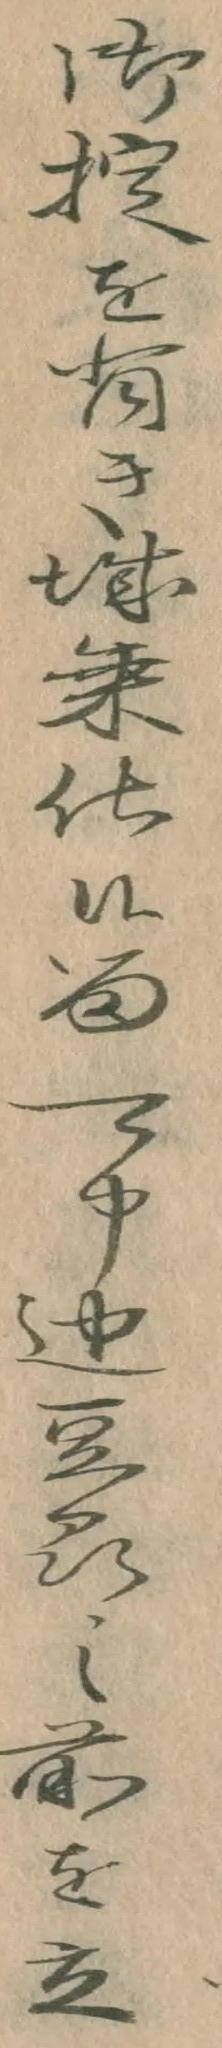御掟を背き城乗仕候留可申迚豆州之前を立
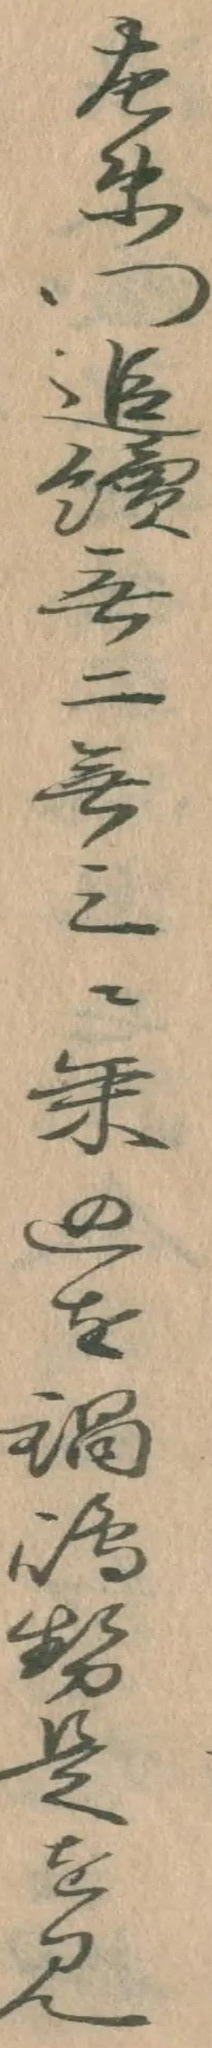左衛門追続無二無三に乗込を鍋島勢是を見
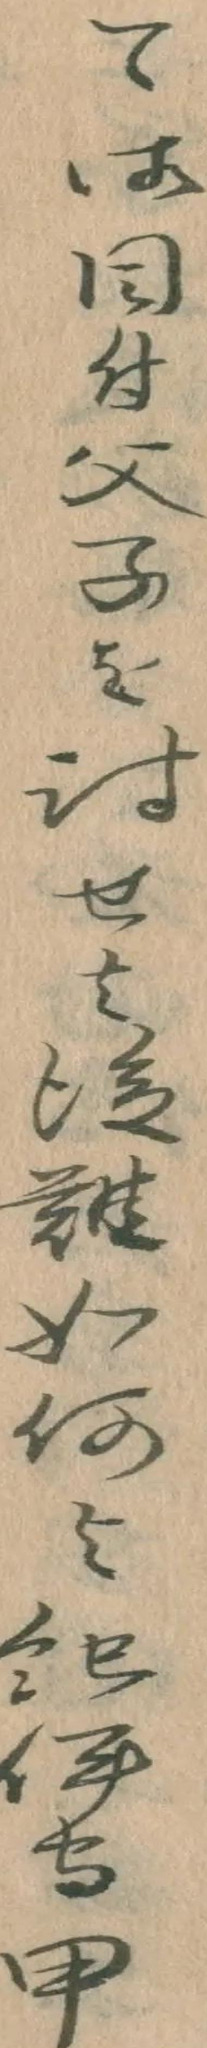て御目付父子を討せ者後難如何与紀伊守甲
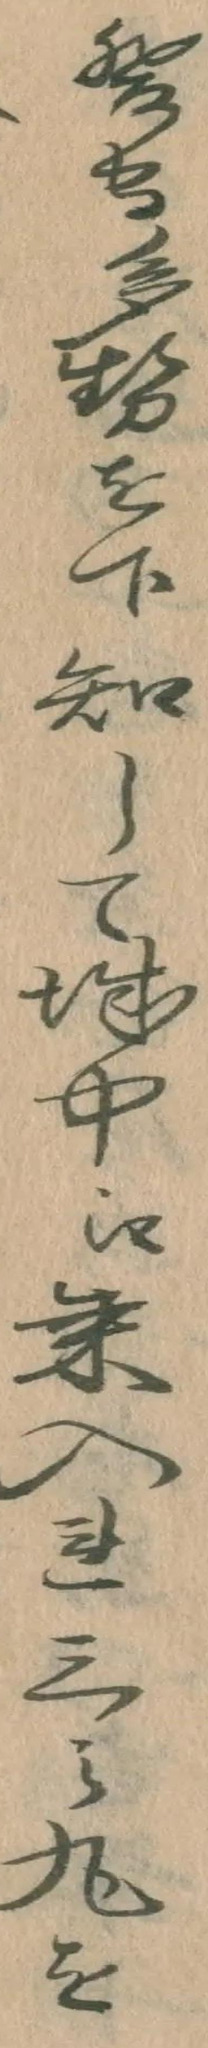斐守多勢を下知して城中江乗入連三之丸を
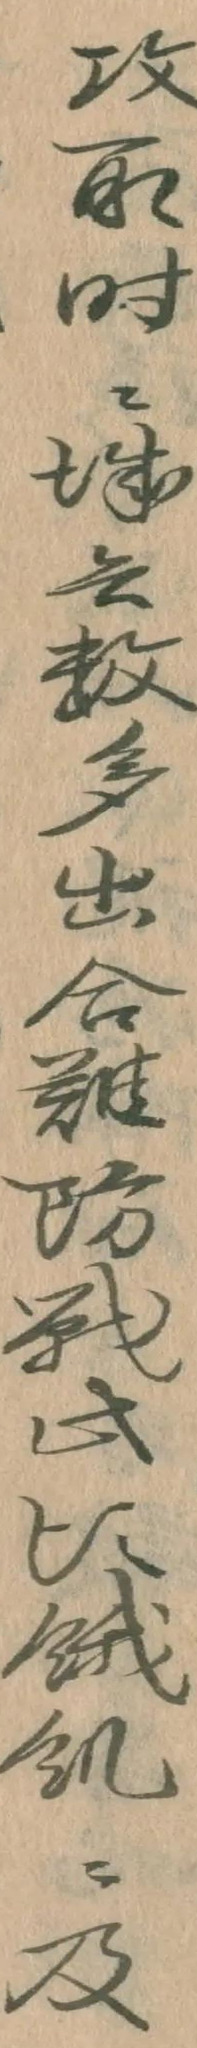攻取時に城兵数多出合難防戦此頃餓飢に及
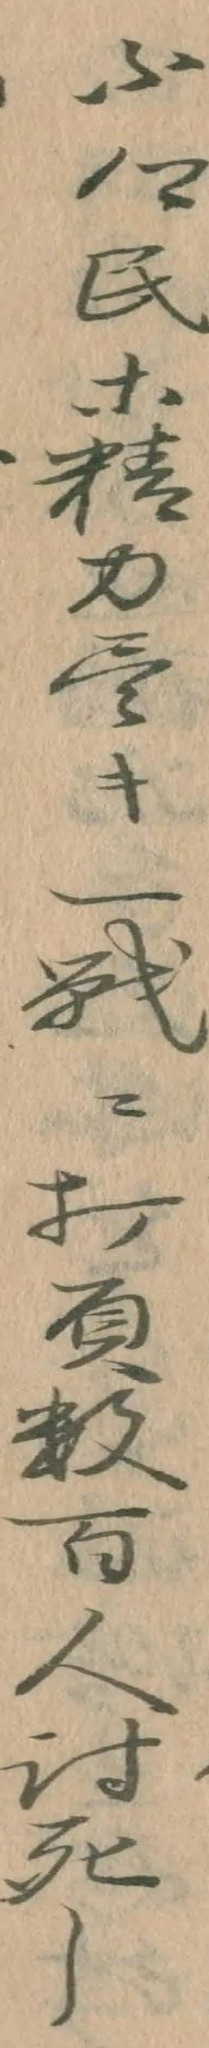ふ郷民等精力尽き一戦に打負数百人討死し
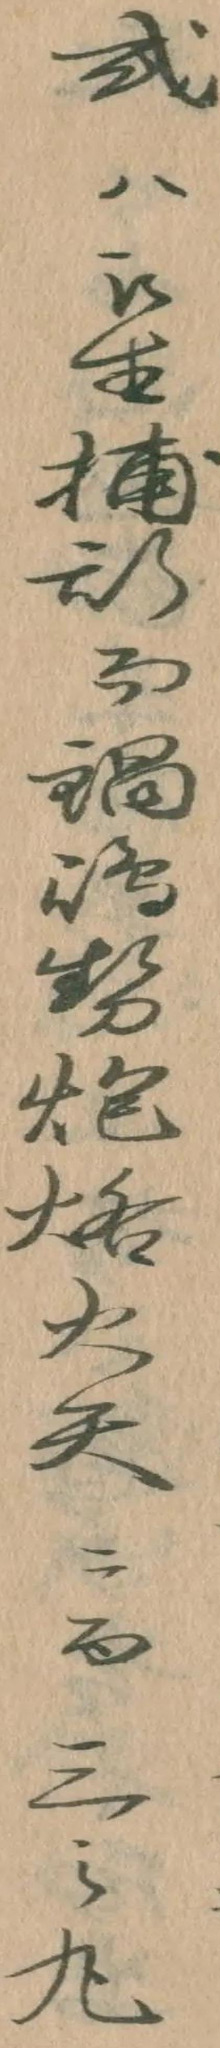或は被生捕斯而鍋島勢炮烙火矢に而三之丸
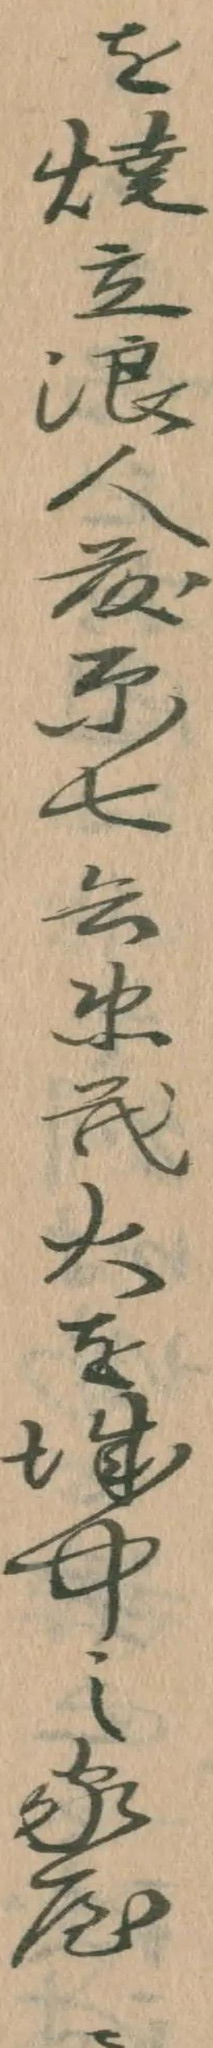を焼立浪人藤原七兵衛茂火を城中之家屋に
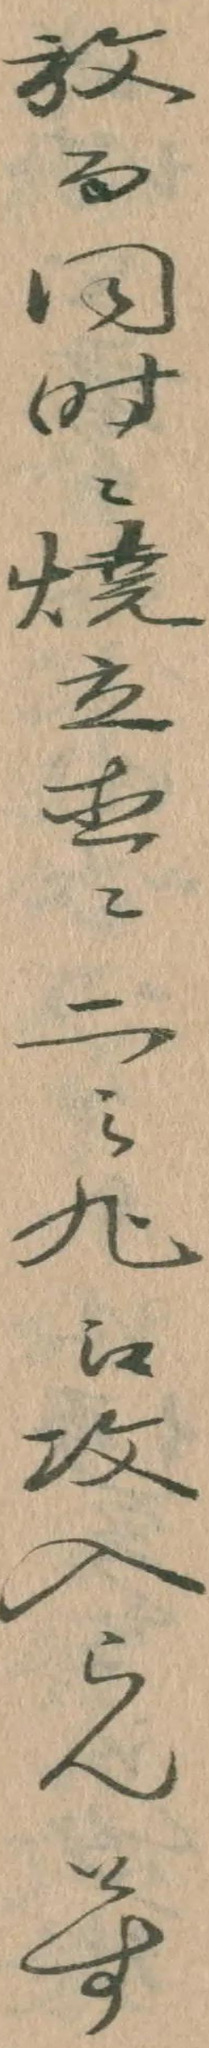放而同時に焼立直に二之丸江攻入らんとす
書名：切支丹御退治記 49巻. [7]
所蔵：国立国会図書館 National Diet Library, JAPAN
